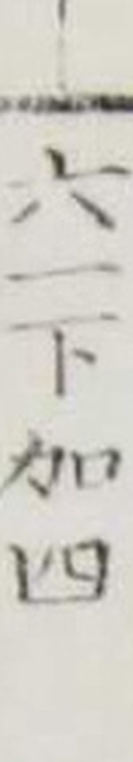六一下加四
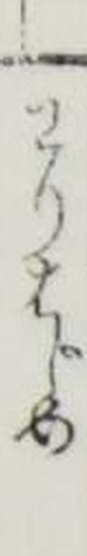わりはじめ
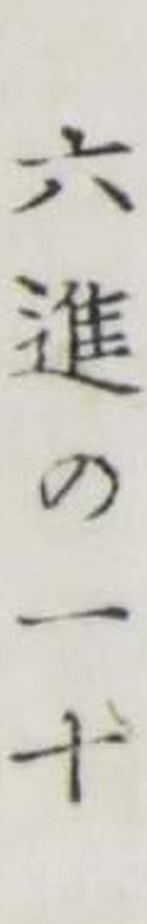六進の一十

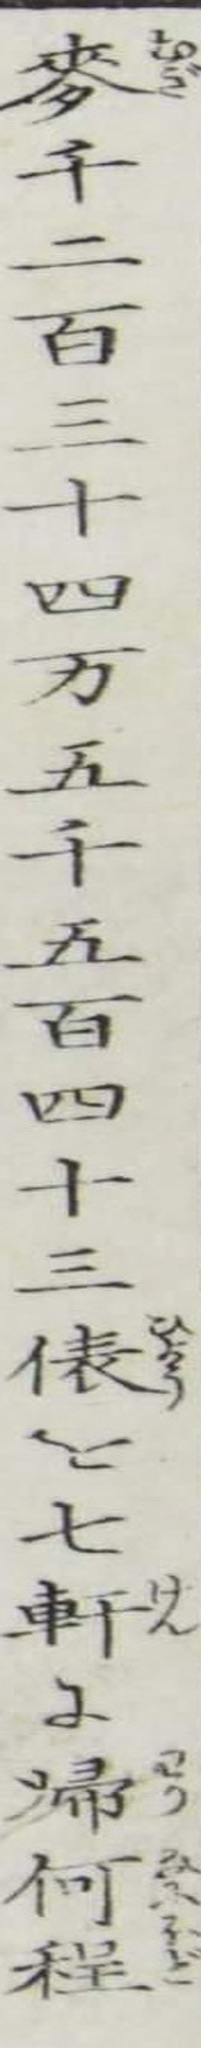麦千二百三十四万五千五百四十三俵を七軒帰何程
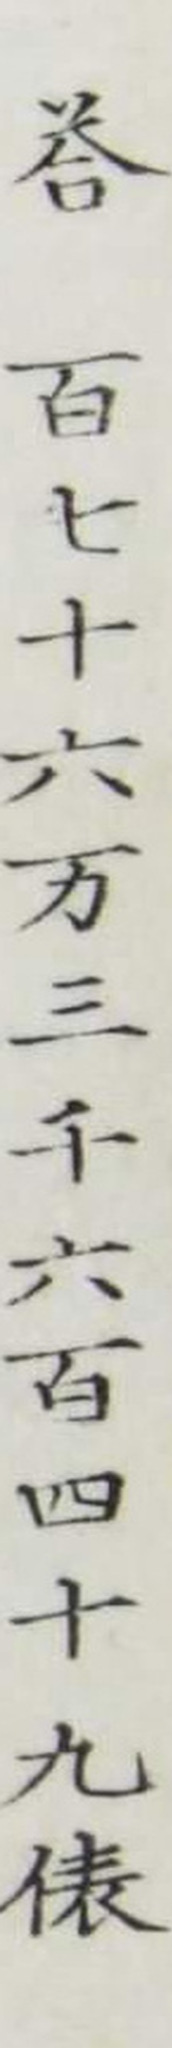答百七十六万三千六百四十九俵
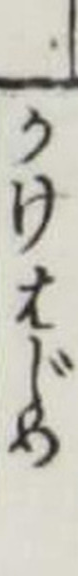わりはじめ
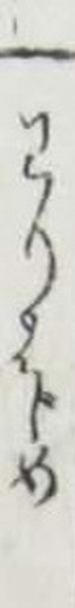わりはじめ
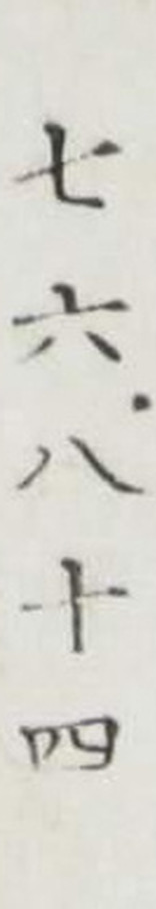七六．八十四
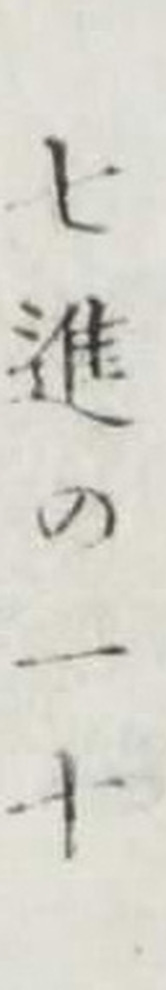七進の一十
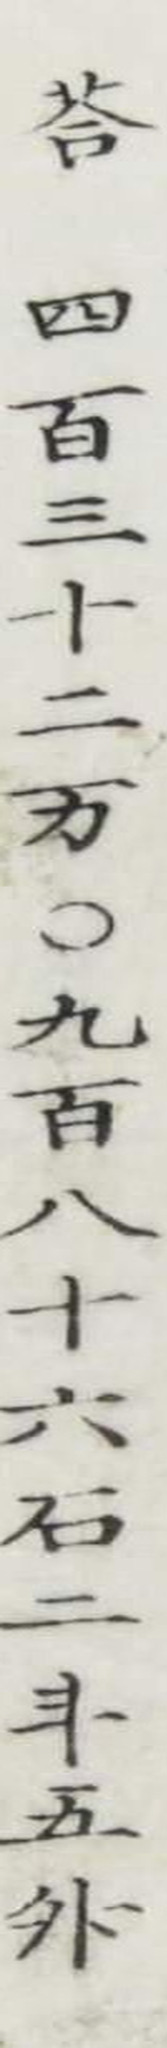答四百三十二万〇九百八十六石二斗五升
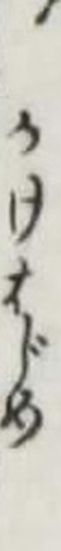わりはじめ
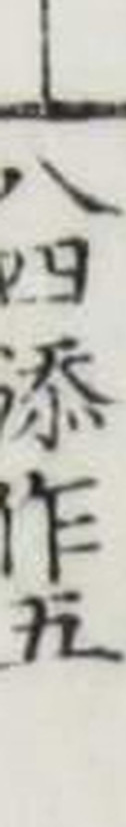八四添作五
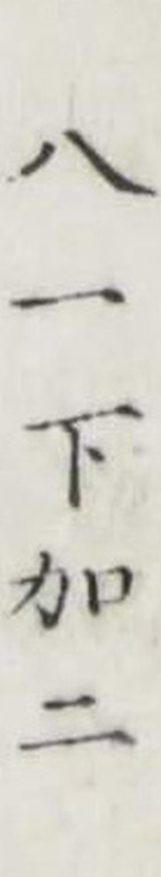八一下加二
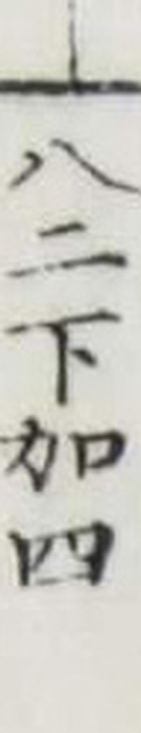八二下加四
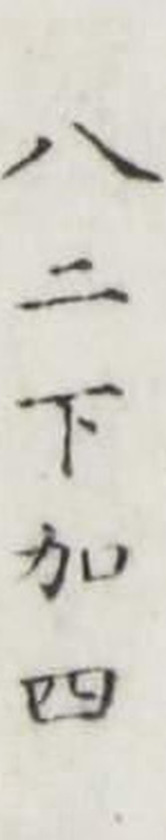八二下加四
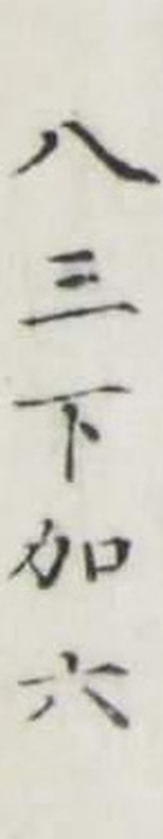八三下加六
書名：明治小學塵劫記 卷1
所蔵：東京学芸大学教育コンテンツアーカイブ
